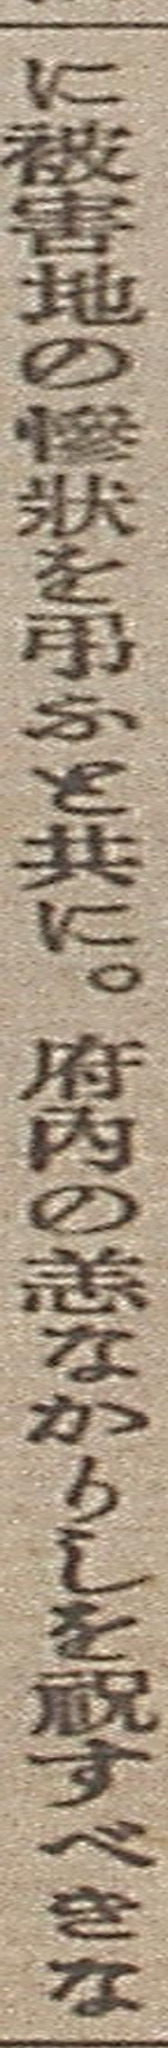に被害地の惨状を弔ふと共に。府内の恙なかりしを祝すべきな
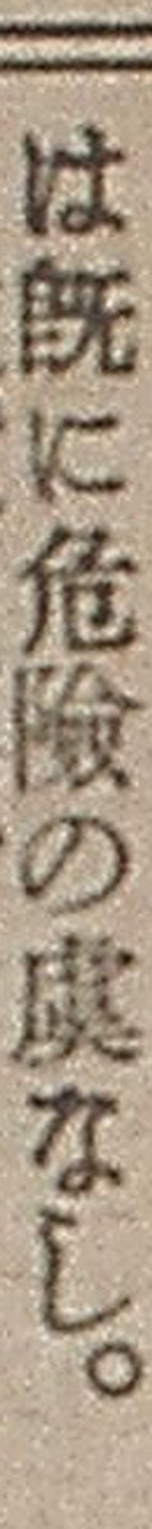は既に危険の虞なし。
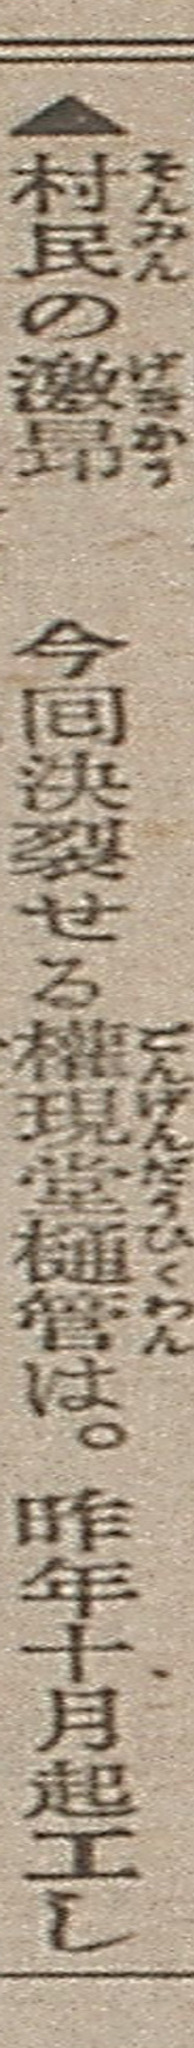▲村民の激昂今回決壊せる権現堂樋管は。昨年十月起工し
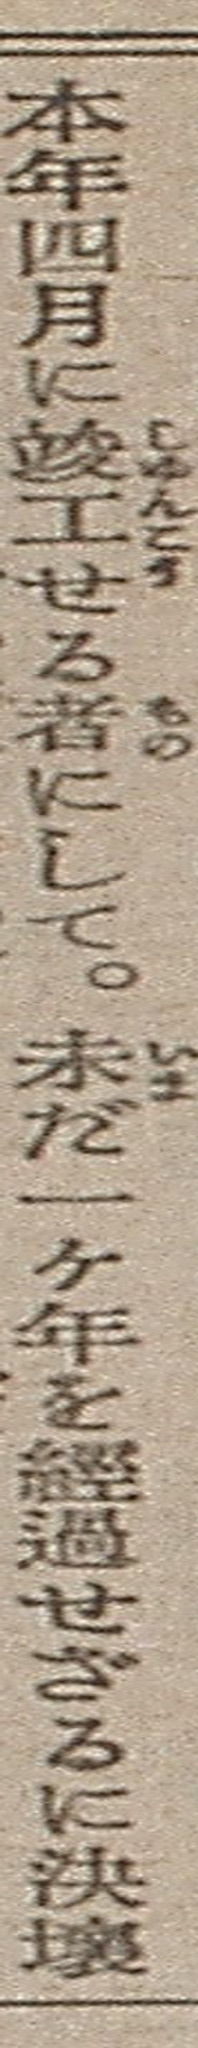本年四月に竣工せる者にして。未だ一ケ年を経過せざるに決壊
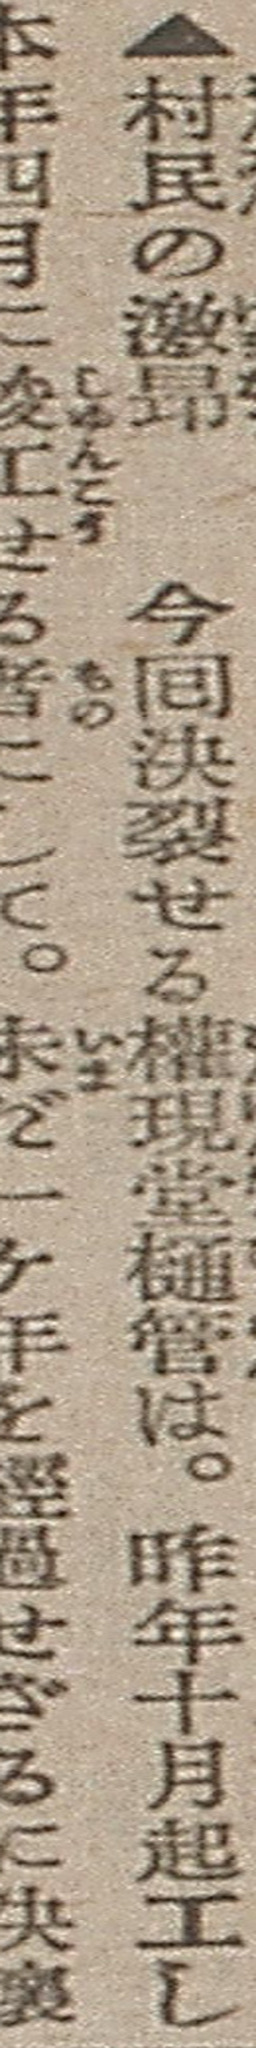本年四月に竣工せる者にして。未だ一ケ年を経過せざるに決壊
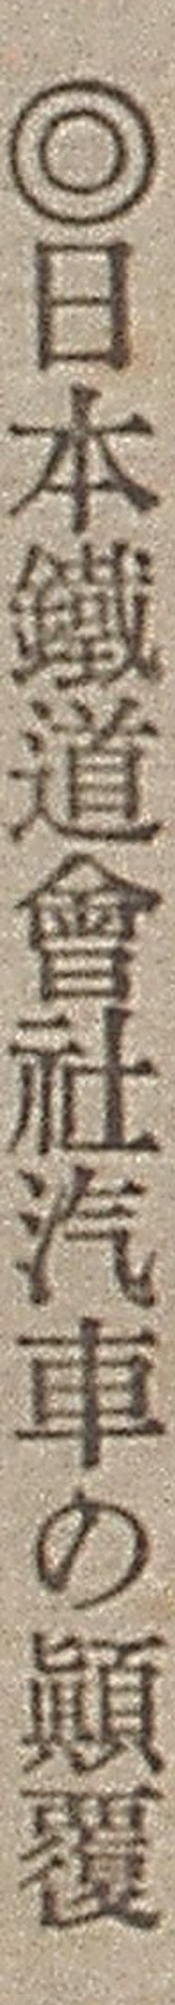◎日本鉄道会社汽車の顛覆
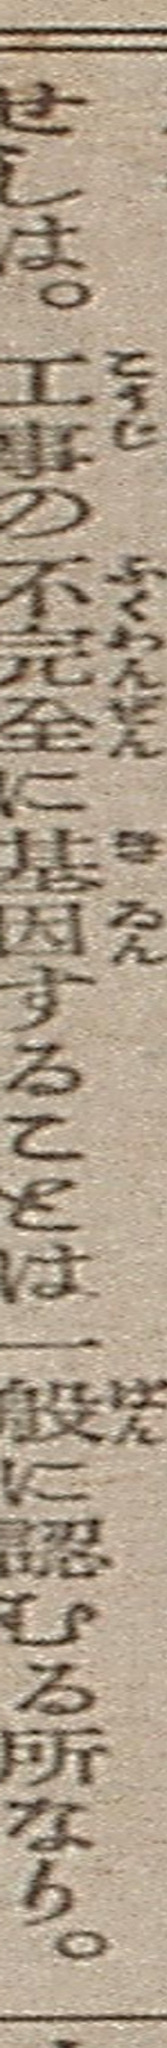せしは。工事の不完全に基因することは一般に認むる所なり。
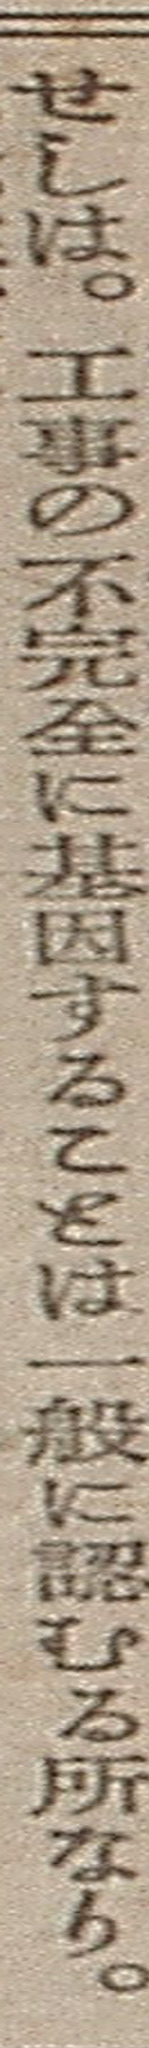せしは。工事の不完全に基因することは一般に認むる所なり。
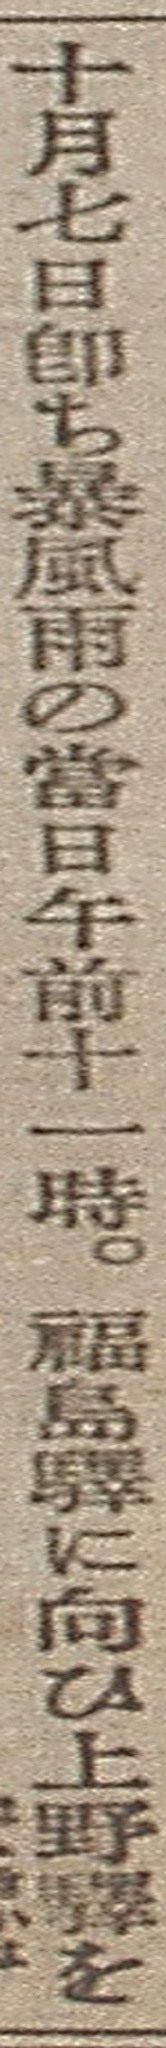十月七日即ち暴風雨の当日午前十一時。福島駅に向ひ上野駅を
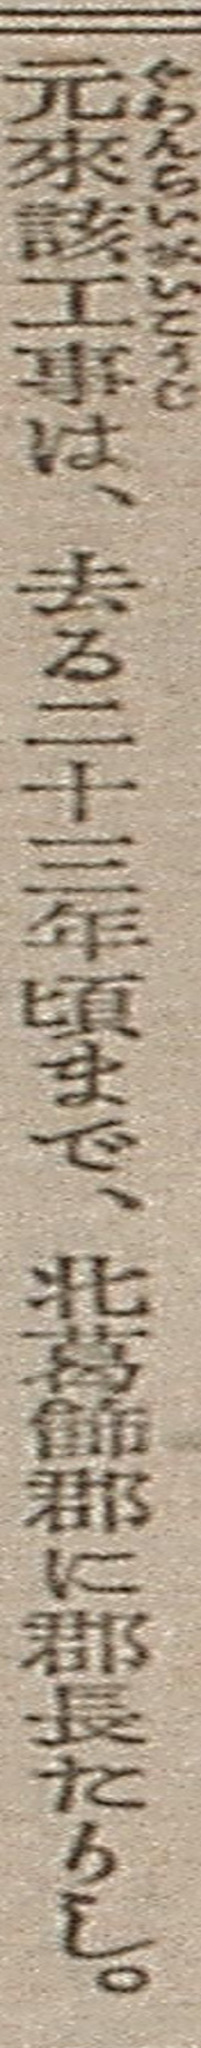元来該工事は、去る二十三年頃まで、北葛飾郡に郡長たりし。
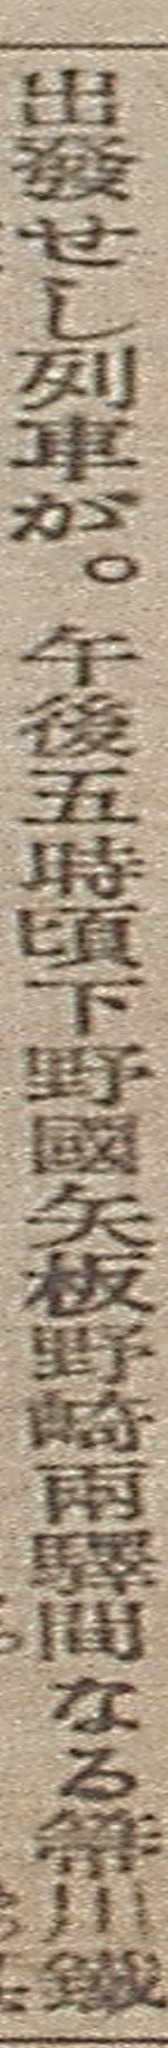出発せし列車が。午後五時頃下野国矢板野崎両駅間なる箒川鉄
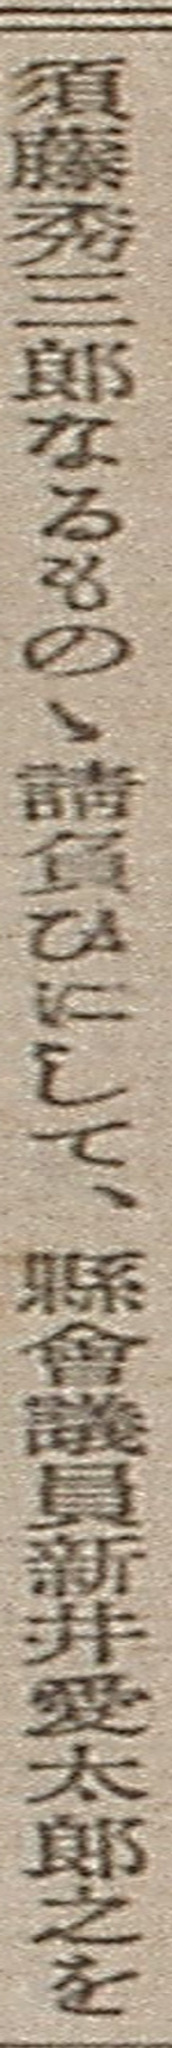須藤秀三郎なるものゝ請負ひにして、県会議員新井愛太郎之を
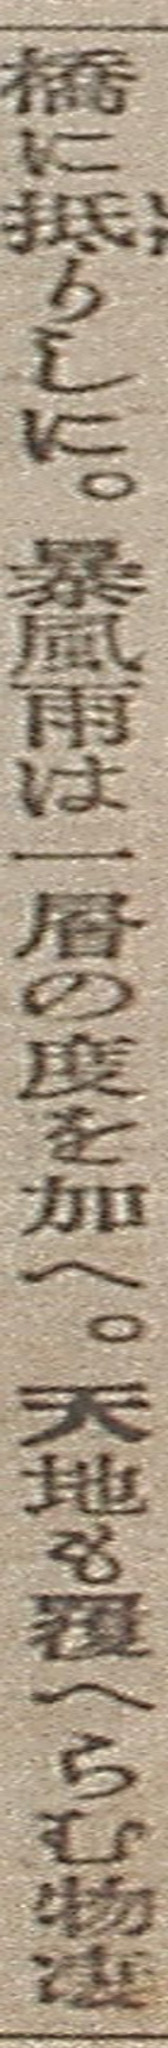橋に抵りしに。暴風雨は一層の度を加へ。天地も覆へらむ物凄
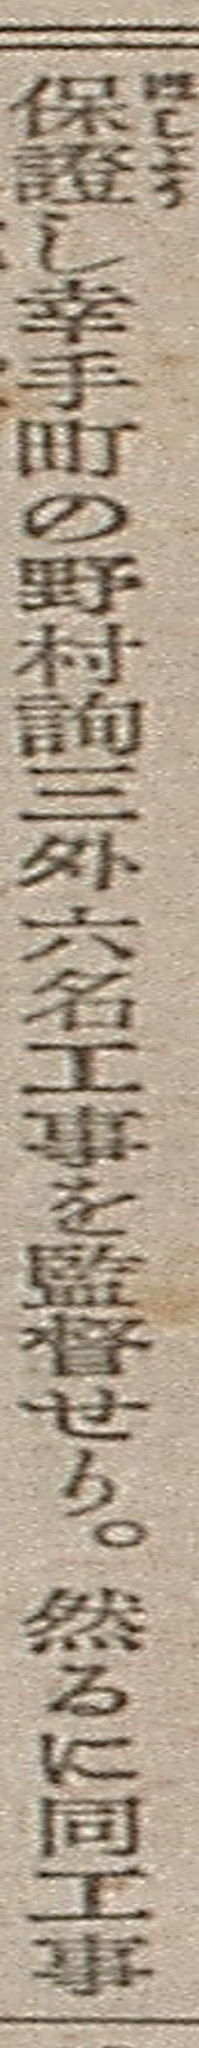保証し幸手町の野村絢三外六名工事を監督せり。然るに同工事
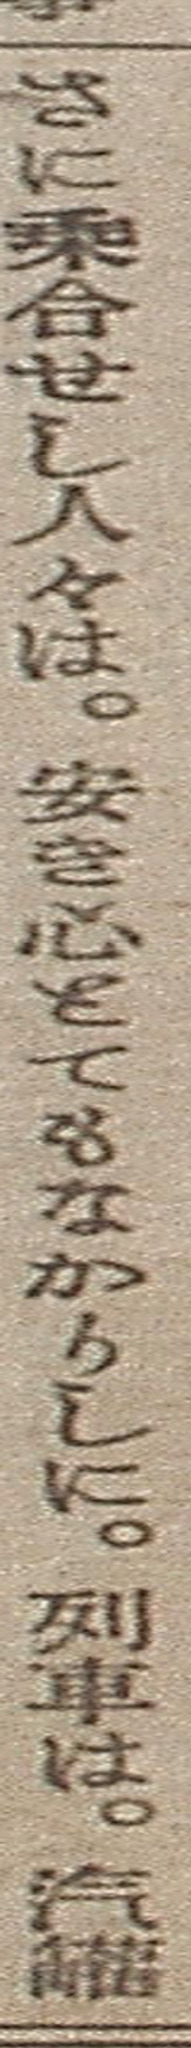さに乗合せし人々は。安き心とてもなかりしに。列車は。汽罐
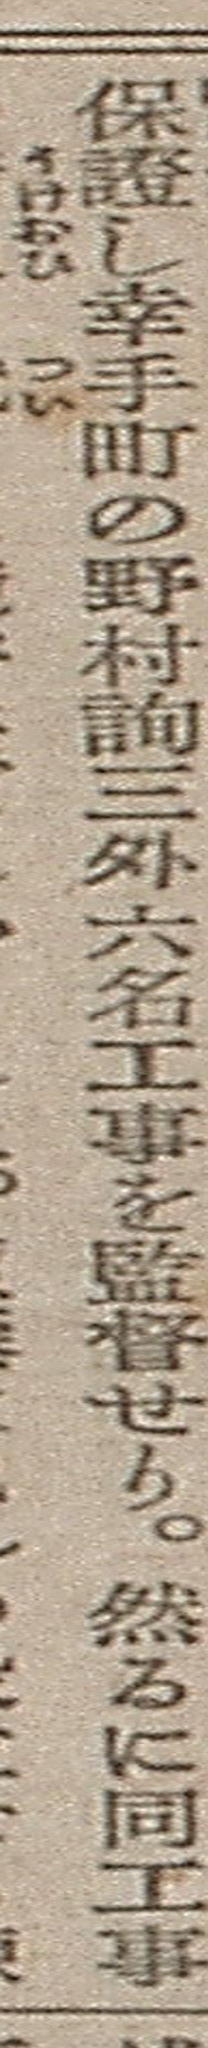保証し幸手町の野村絢三外六名工事を監督せり。然るに同工事
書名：風俗畫報臨時増刊第百九十九號　明治三十二年十月各地災害圖會（前編之續）
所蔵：東京大学地震研究所図書室 Earthquake Research Institute Library, The University of Tokyo, JAPAN
